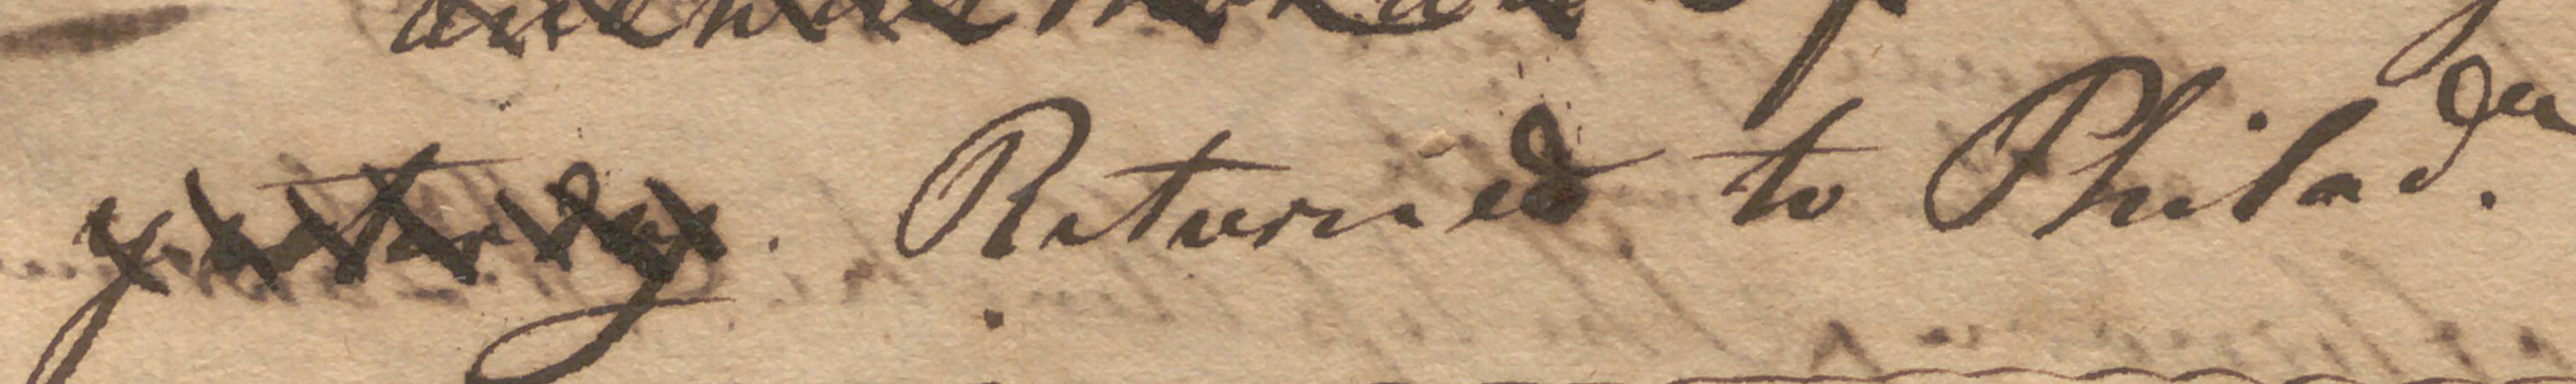[yesterday] Returned to Philad^a.
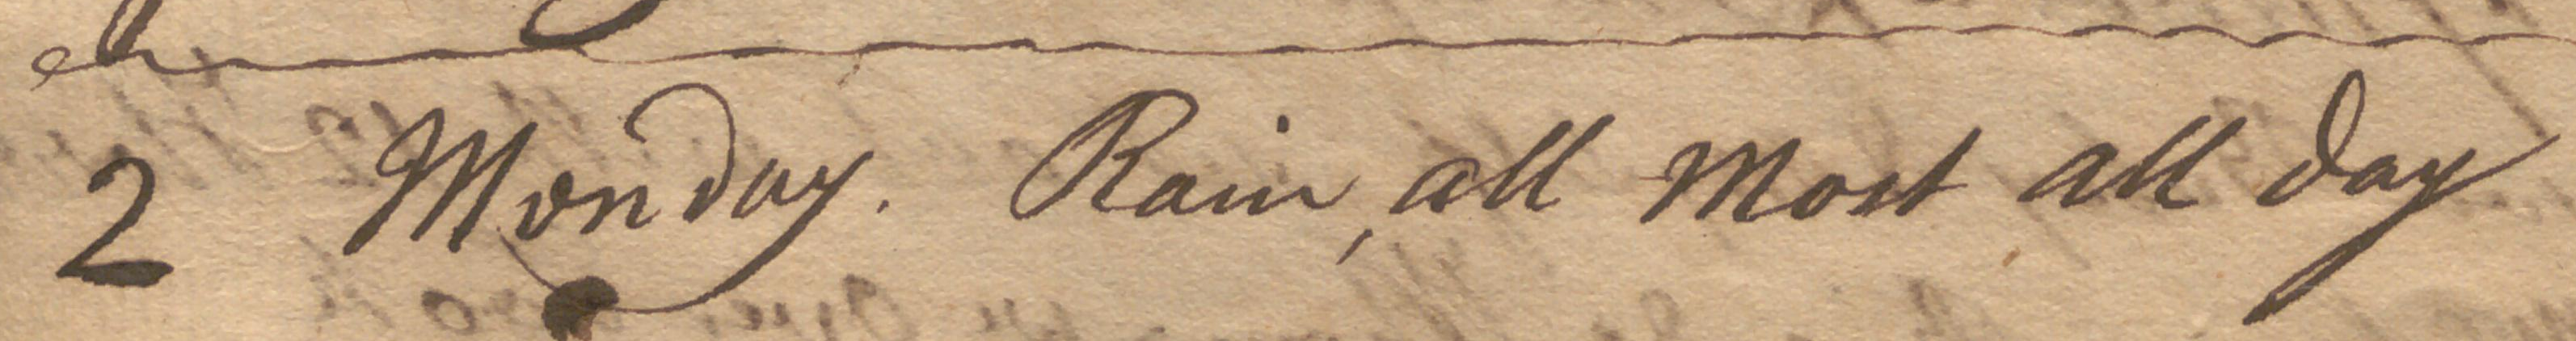2 Monday. Rain all Most all day
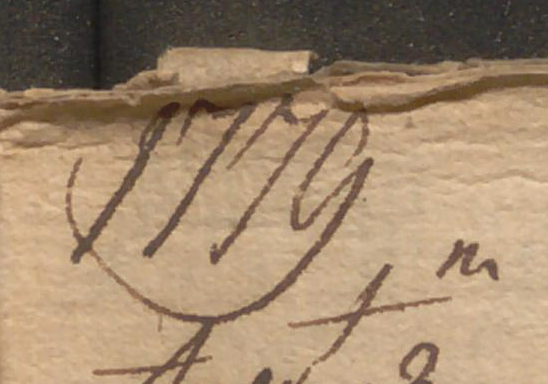1779
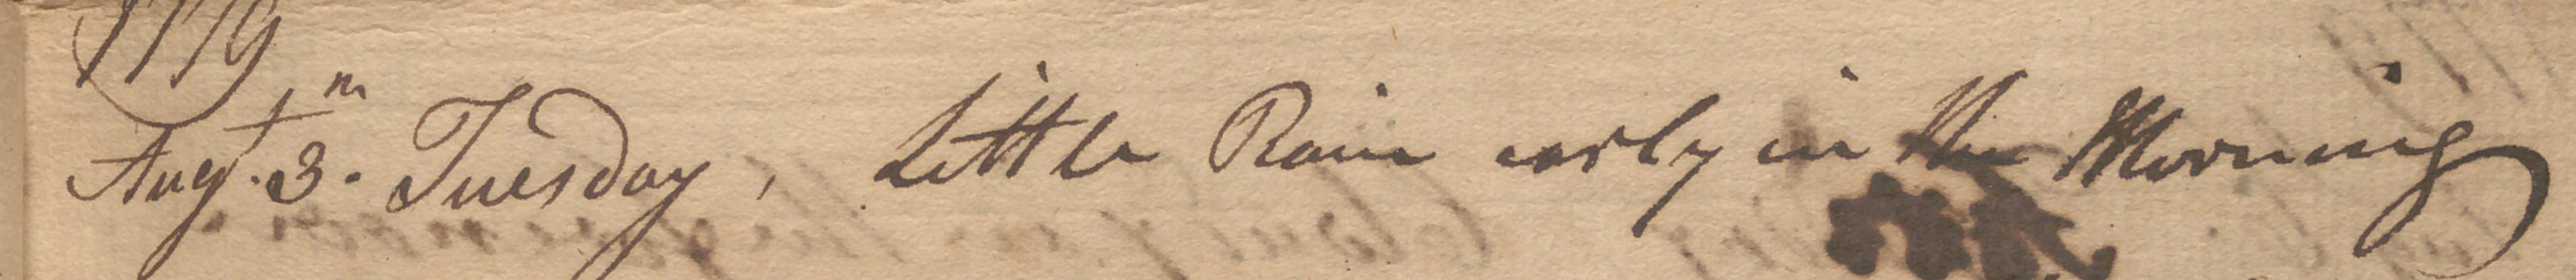Aug^t. 3d Tuesday, Little Rain early in the Morning
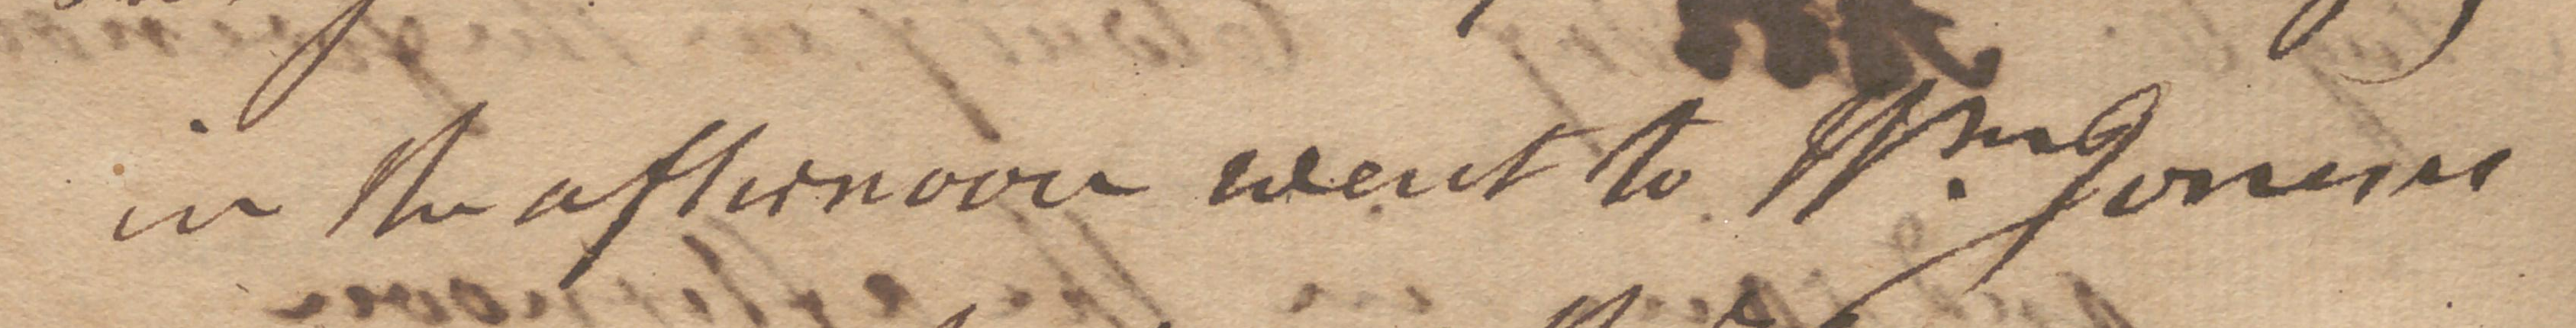in the afternoon went to W^m. Joneses
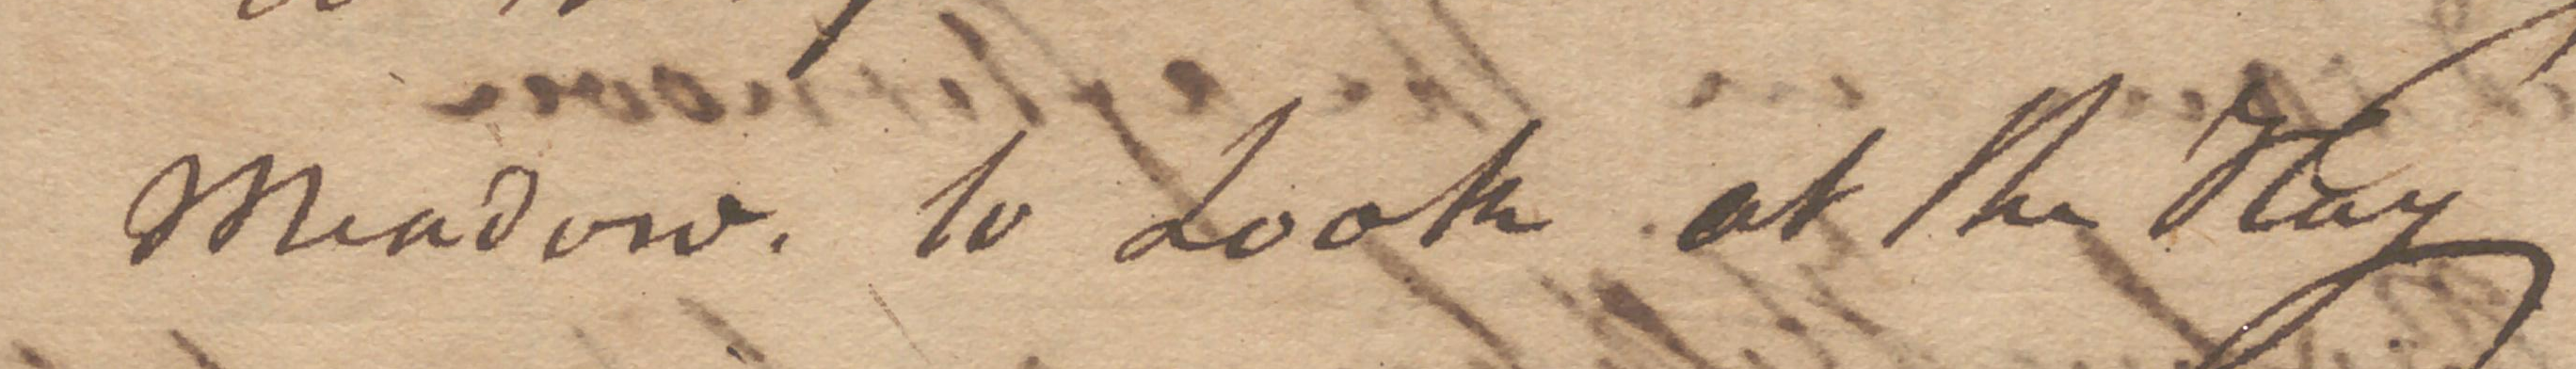Meadow. to Look at the Hay
